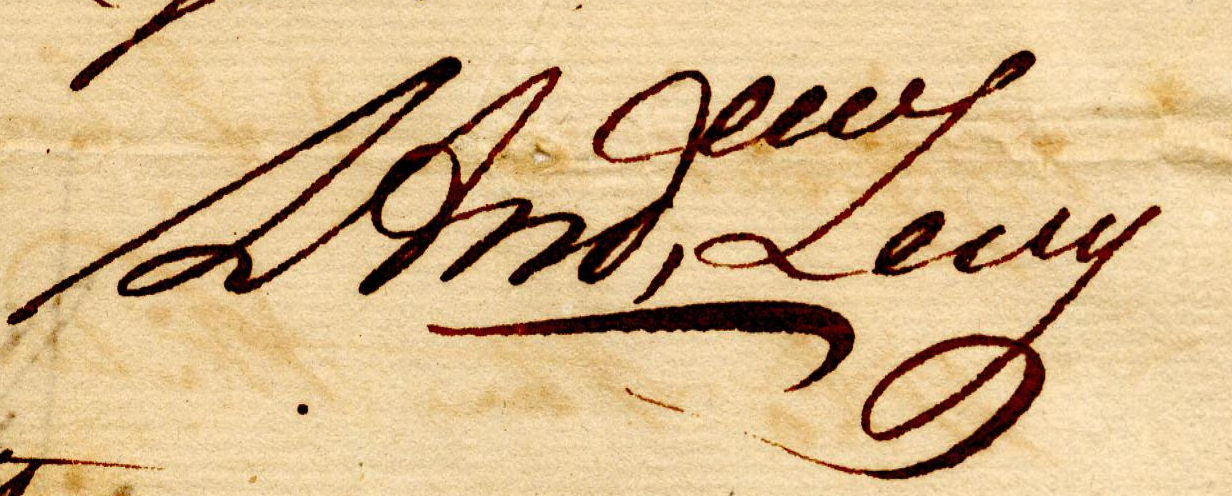And^rew Levy
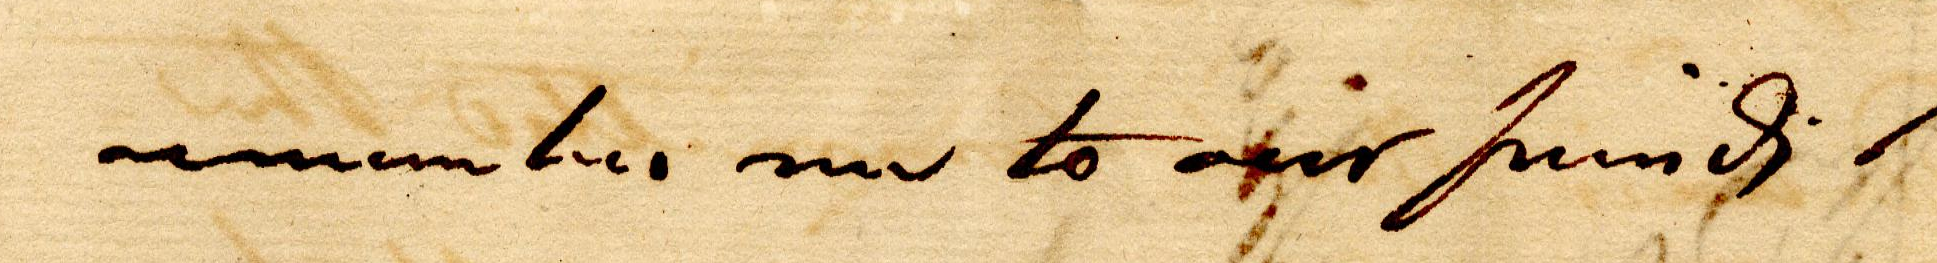remember me our friends
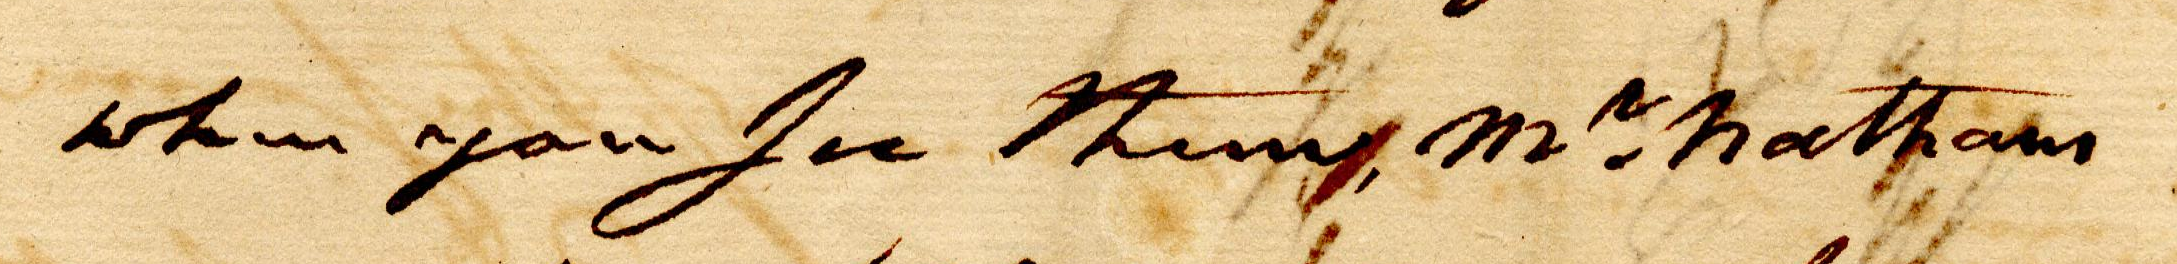when you see them, M^r. Nathans
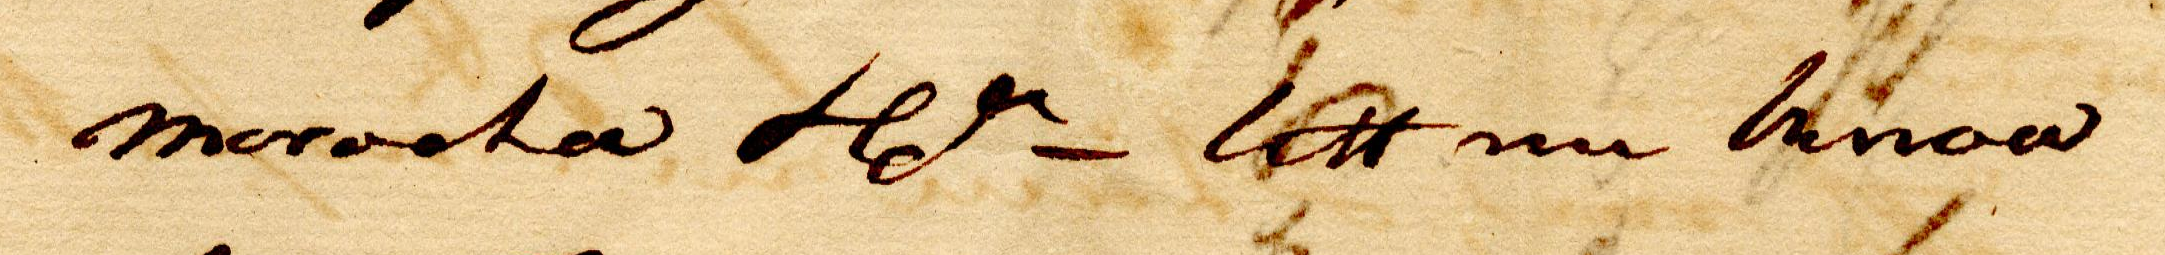Merchan & C^r lett me know
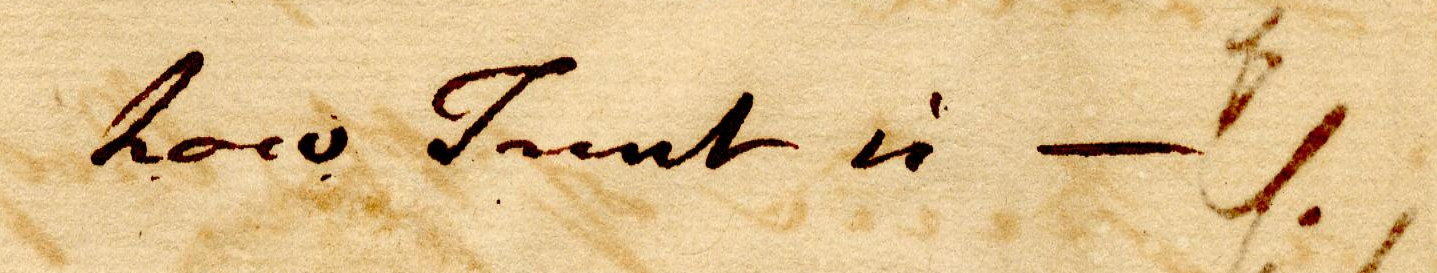how Trent is-
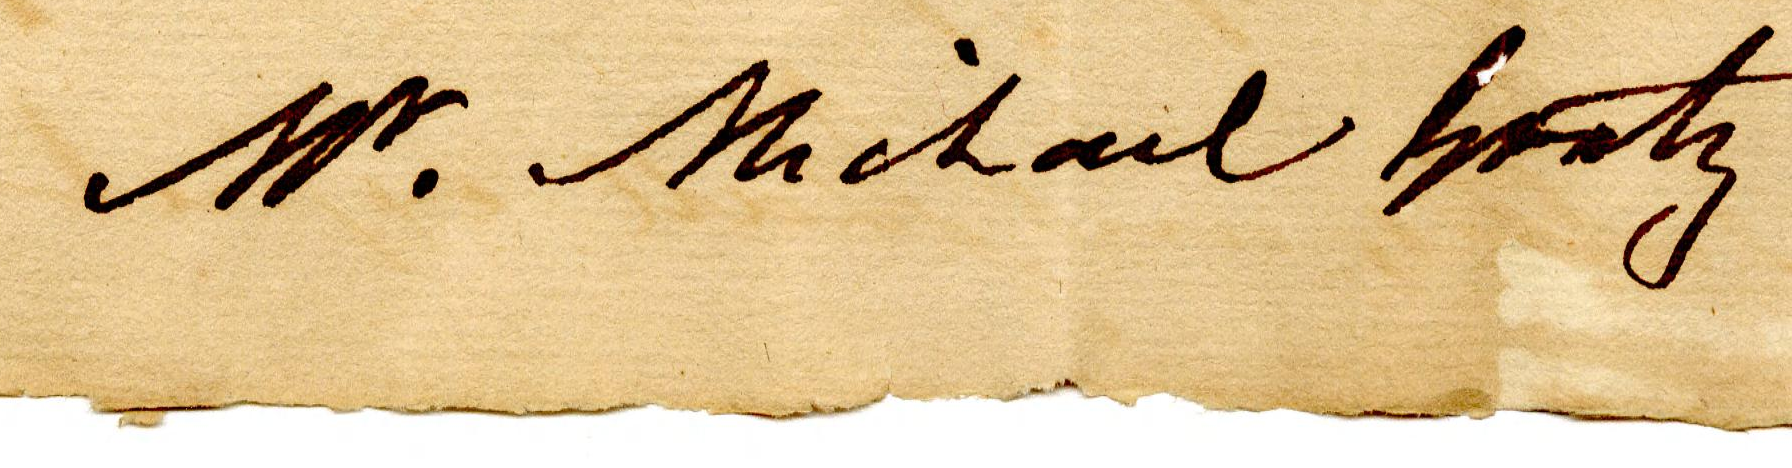M^r. Michael Gratz
